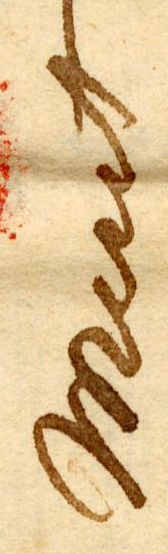Merch^t
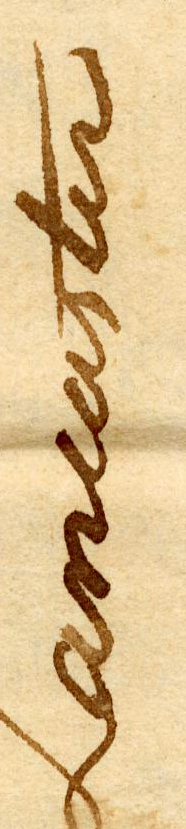Lancaser
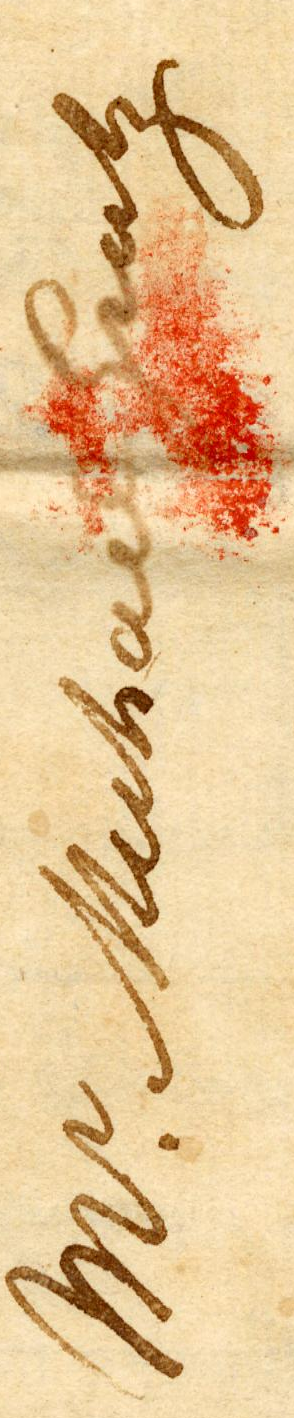M^r Michael Gratz
